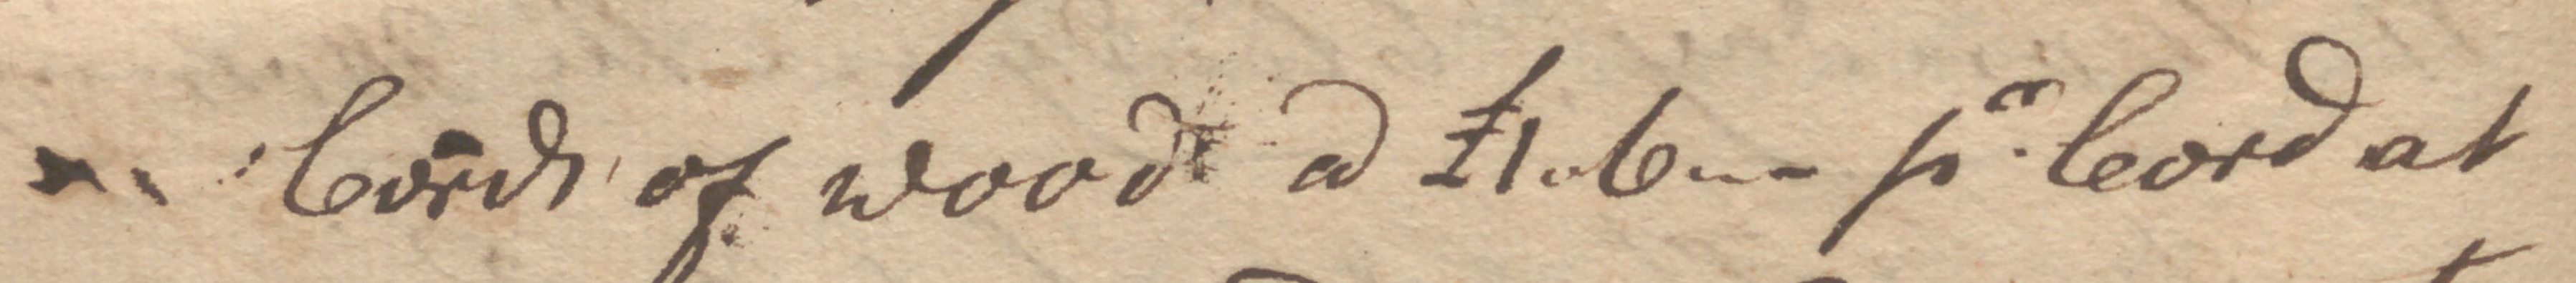Cords of wood @ £1.6. p^r. Cord at
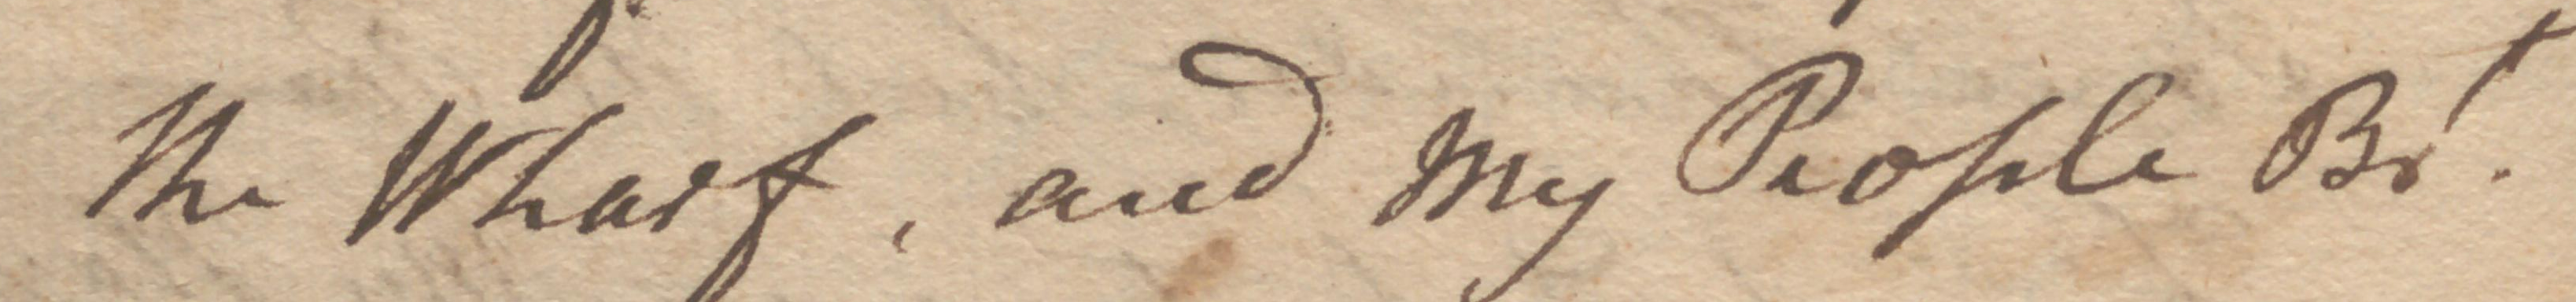the Wharf, and my People Br^t.
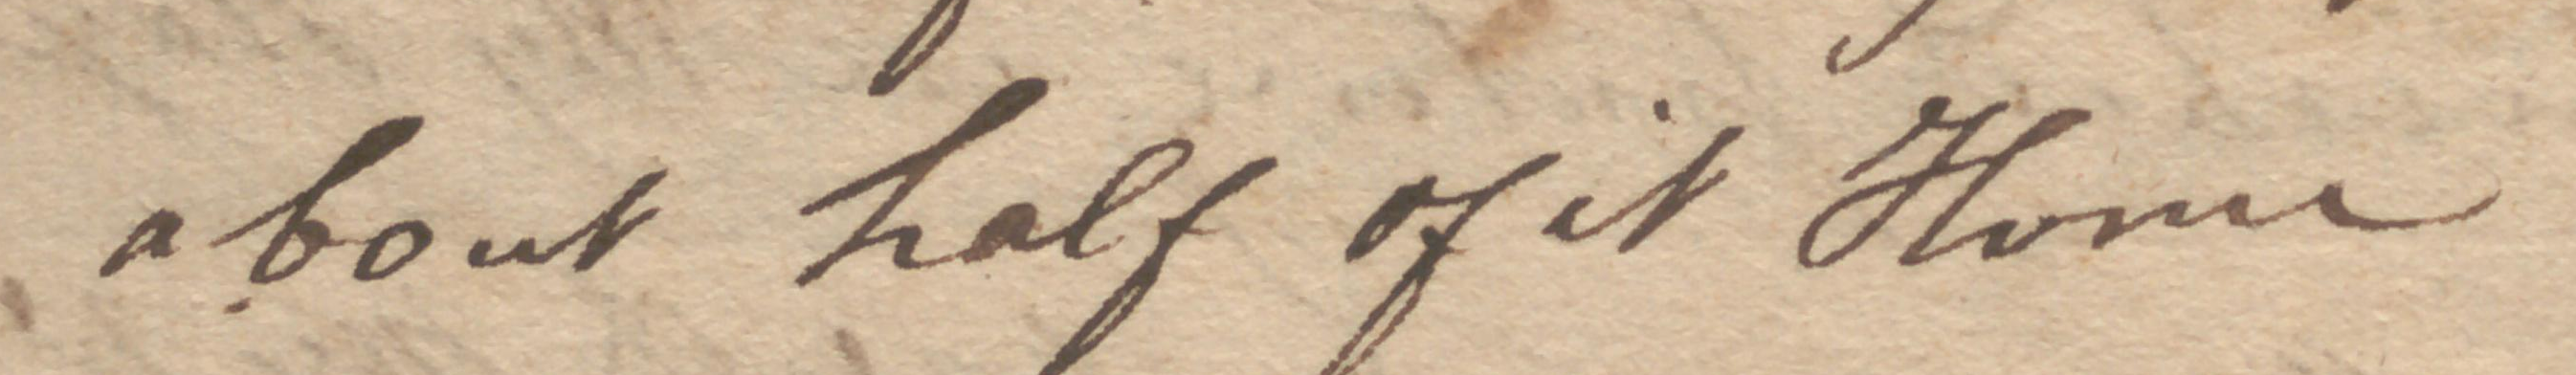about half of it Home
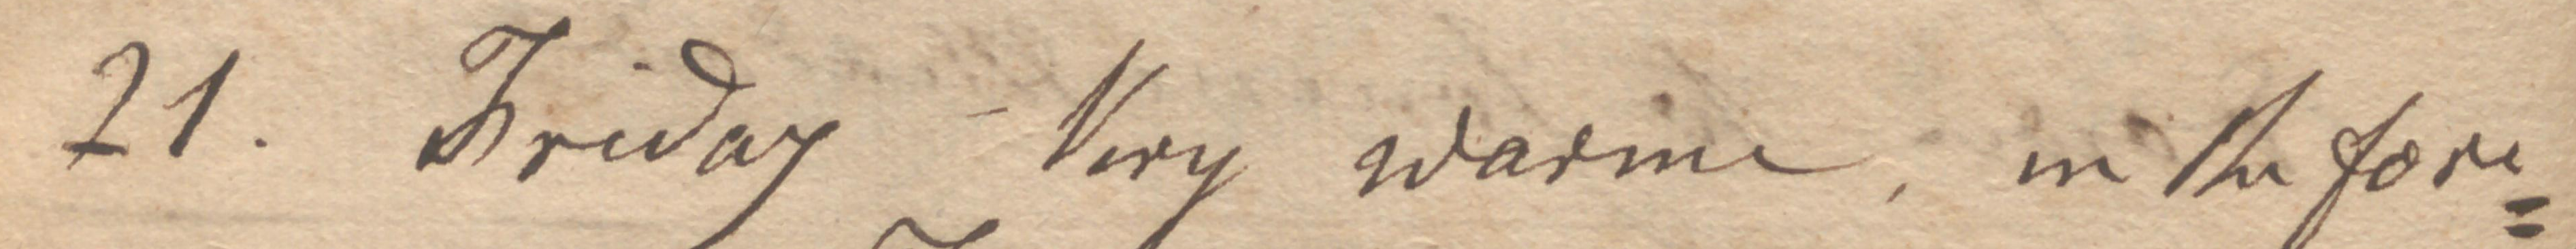21. Friday Very warme, in the fore
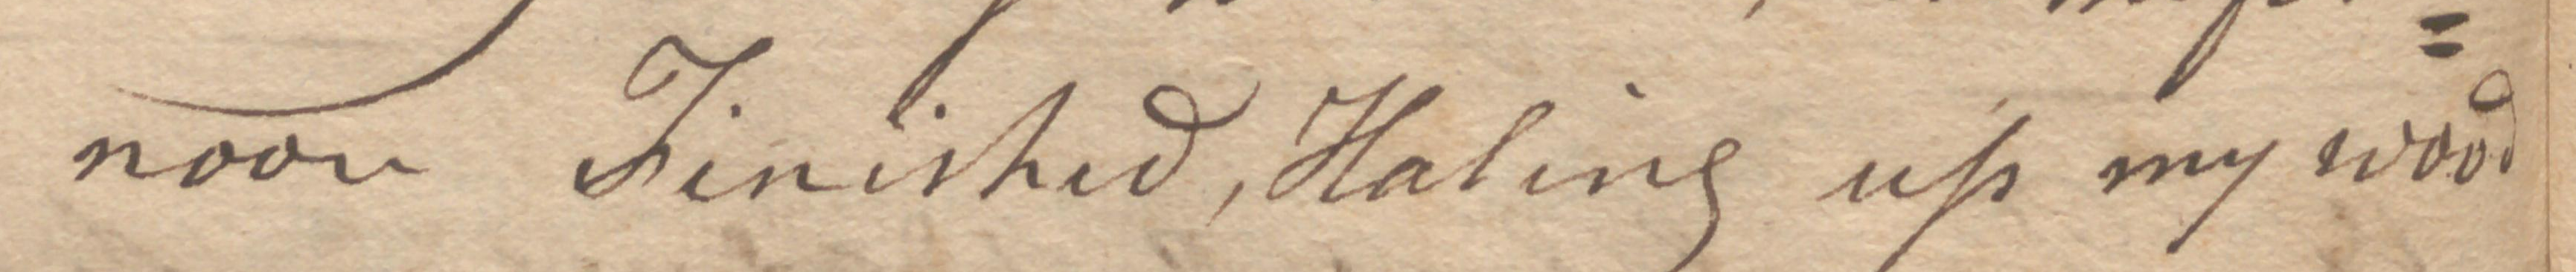noon Finished, Haling up my wood.
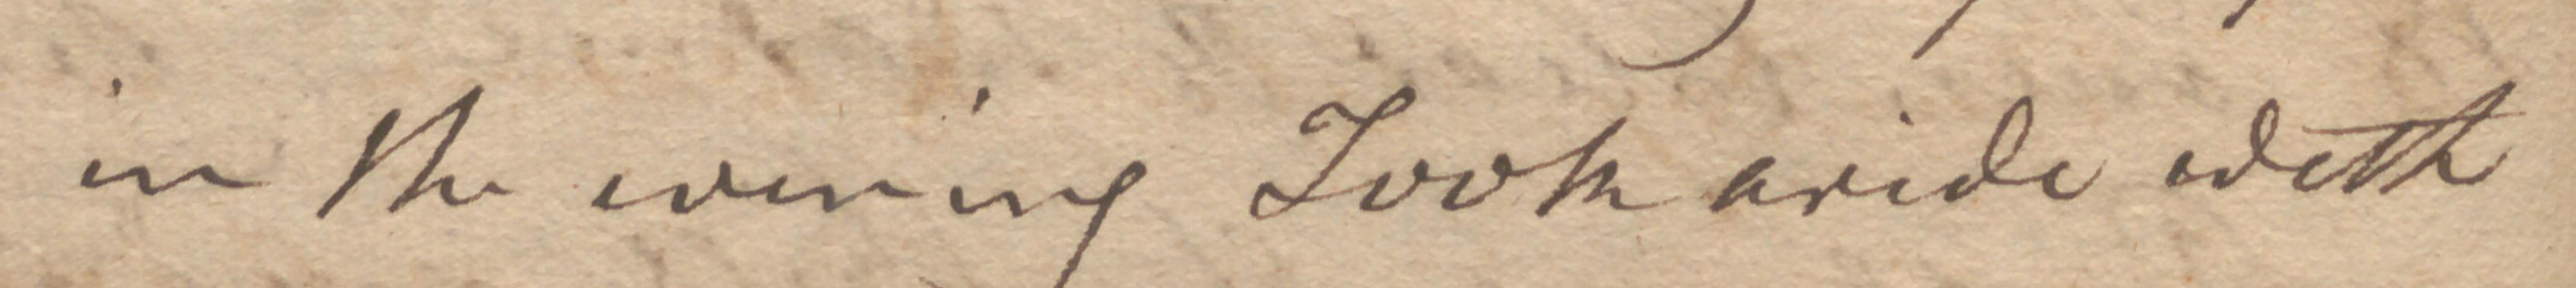in the evening Took a ride with
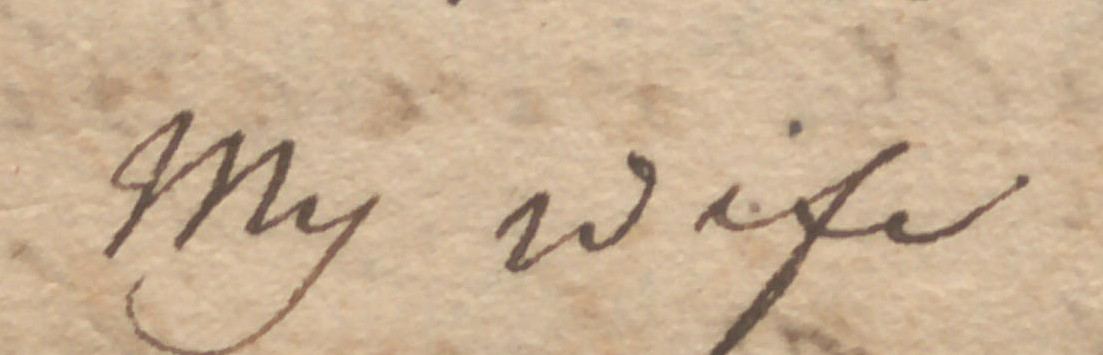My wife
